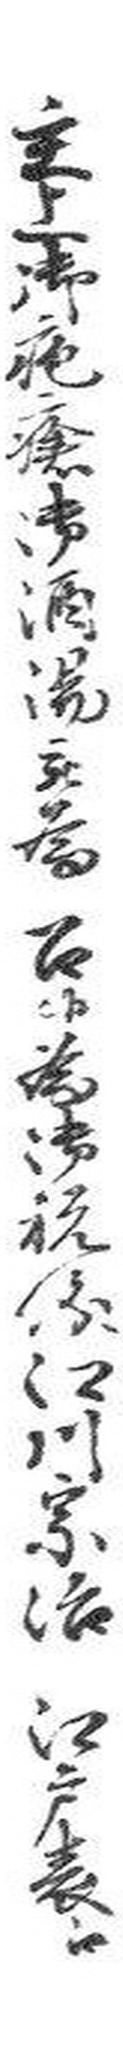主上御疱瘡御酒湯被為召候為御祝儀江川宗治江戸表江
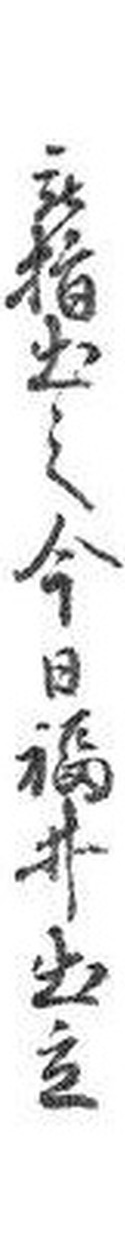被指出之今日福井出立
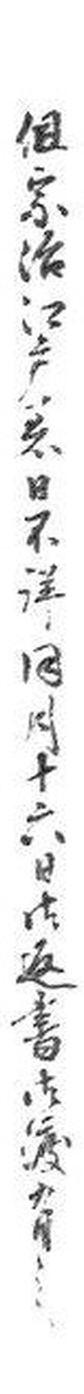但宗治江戸着日不詳同月十六日御返書御渡有之
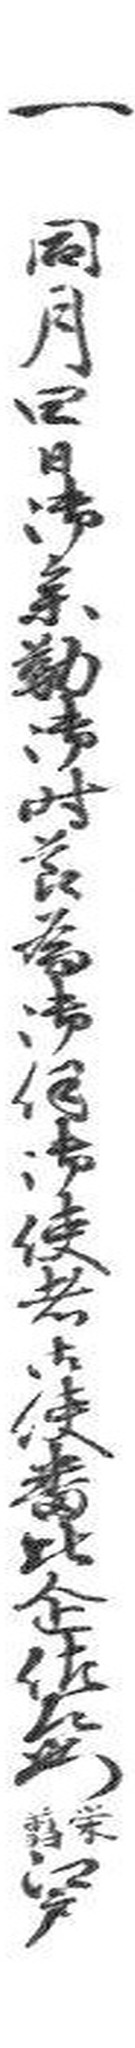一同月四日御参勤御時節為御伺御使者御使番比企佐左衛門栄翦江戸
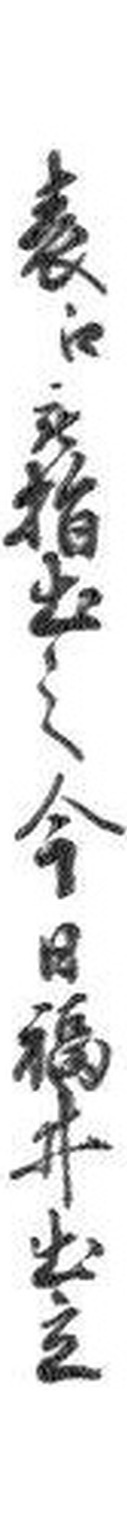表江被指出之今日福井出立
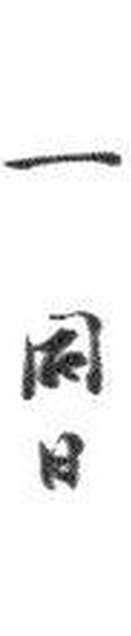一同日
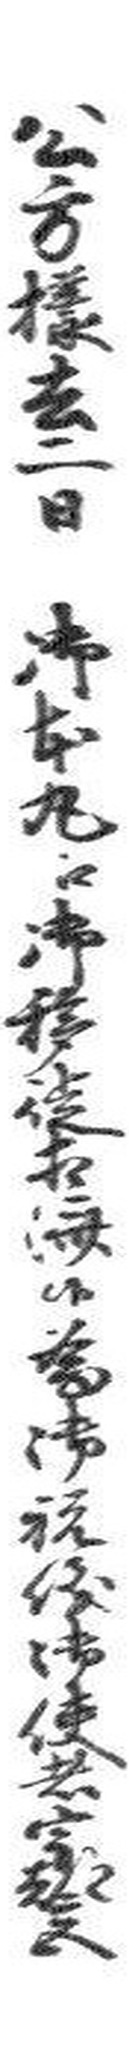公方様去二日御本丸江御移徙相済候為御祝儀御使者宇都宮
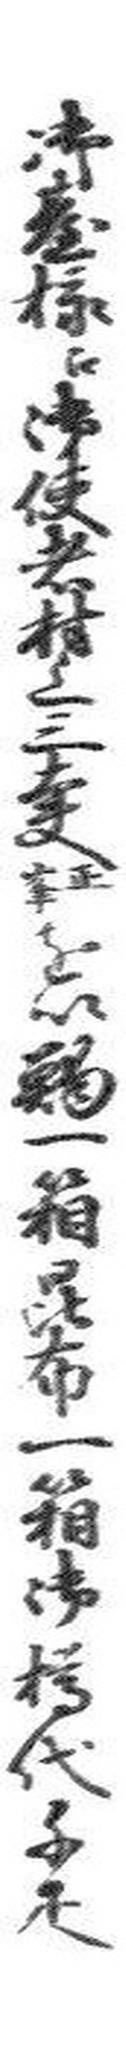御台様江御使者村上三太夫正峯を以鯣一箱昆布一箱御樽代千疋
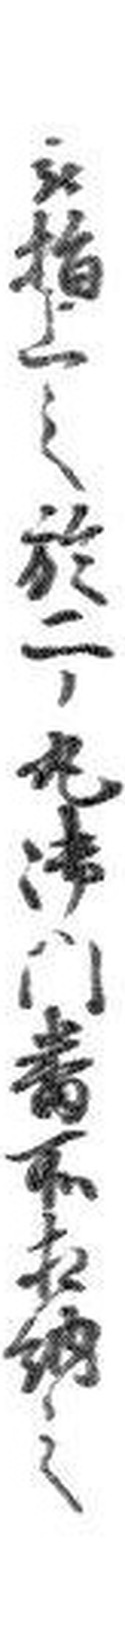被指上之於二ノ丸御門番所相納之
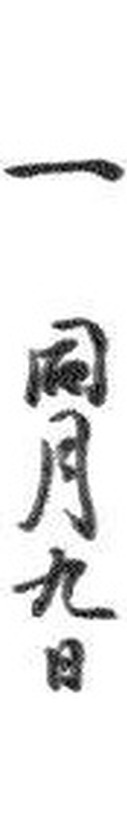一同月九日
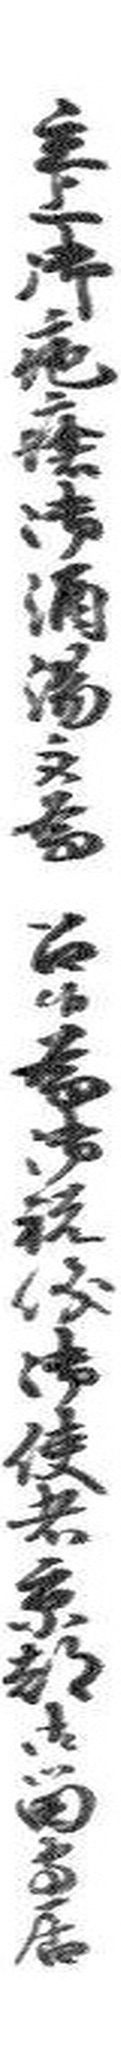主上御疱瘡御酒湯被為召候為御祝儀御使者京都御留守居
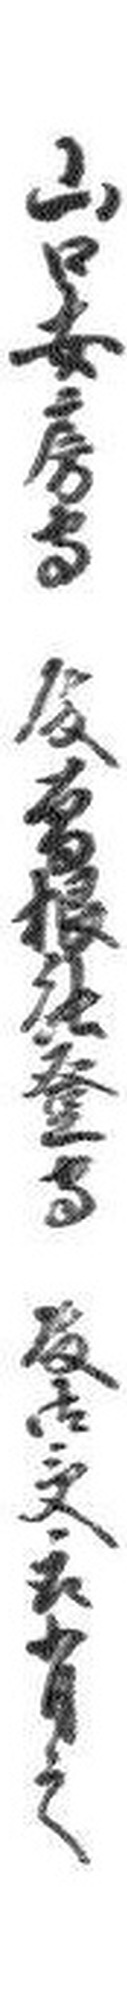山口安房守殿曽根能登守殿御受取有之

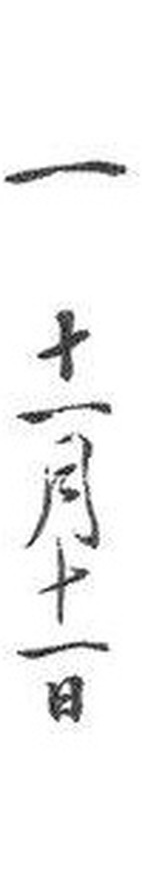一十一月十一日
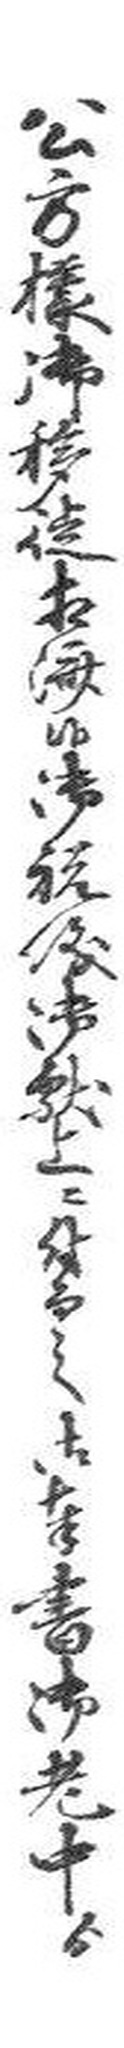公方様御移徙相済候御祝儀御献上ニ付而之御奉書御老中ゟ
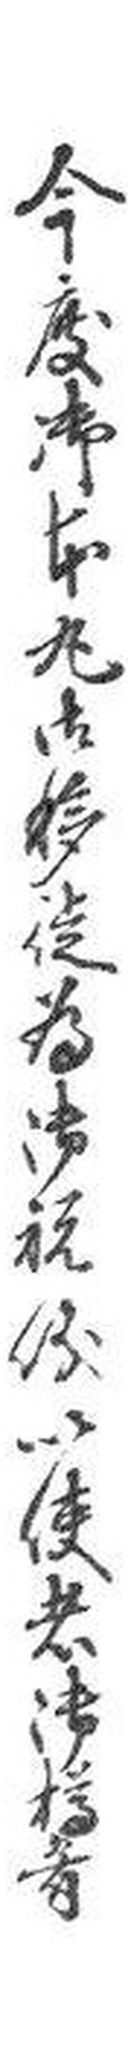今度御本丸御移徙為御祝儀以使者御樽肴
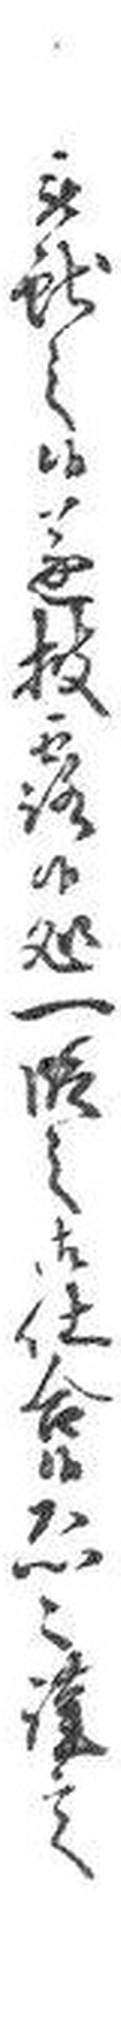被献之候遂披露候処一段之御仕合候恐々謹言
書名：家譜 二十五 吉品公 従宝永六年到同七年
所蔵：福井県文書館 Fukui Prefectural Archives
